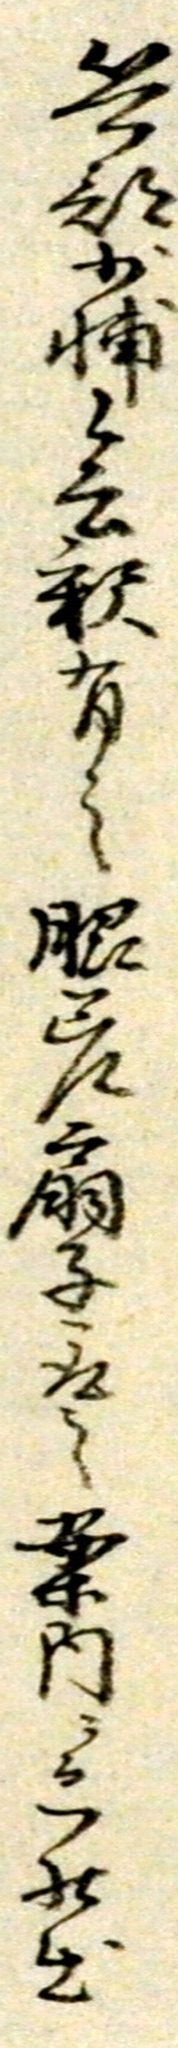兵部少輔と会釈有之脇差扇子取之案内ニ而罷出
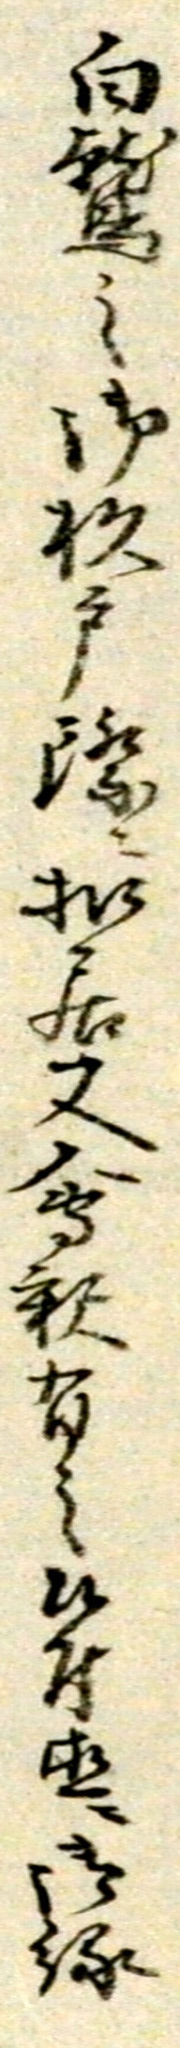白鷲之御杉戸際ニ扣居又会釈有之候付直ニ御縁
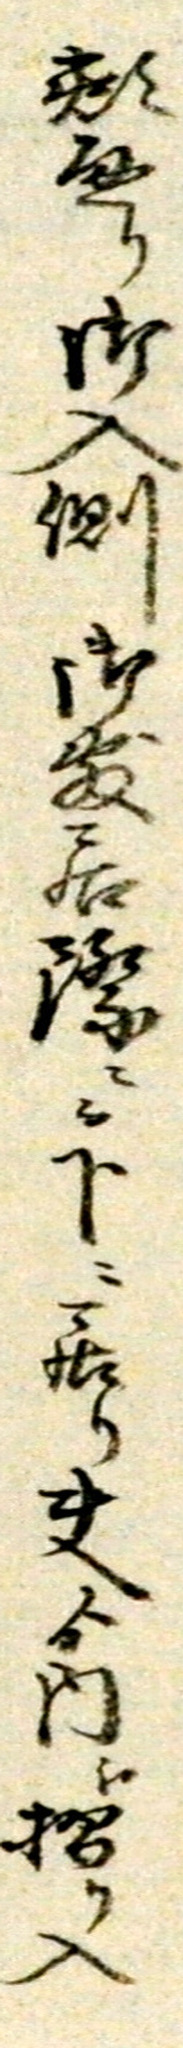頬通り御入側御敷居際ニ被下ニ居り夫ゟ内江摺り入
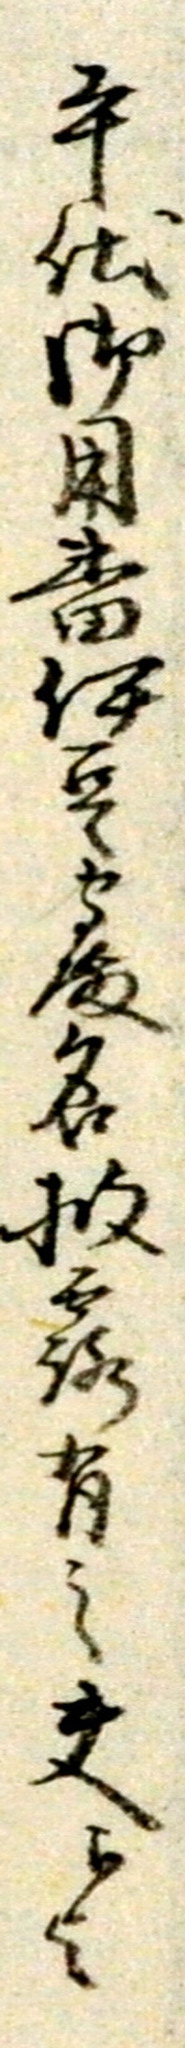平伏御用番伊豆守殿名披露有之夫江と
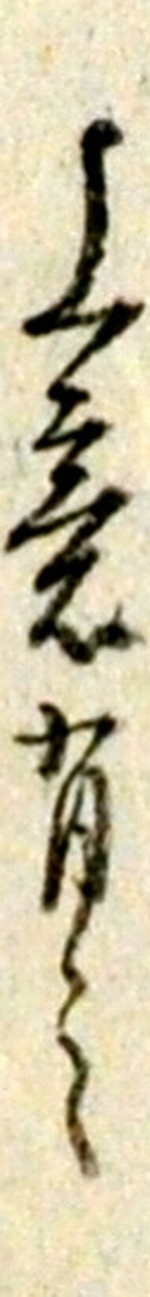上意有之
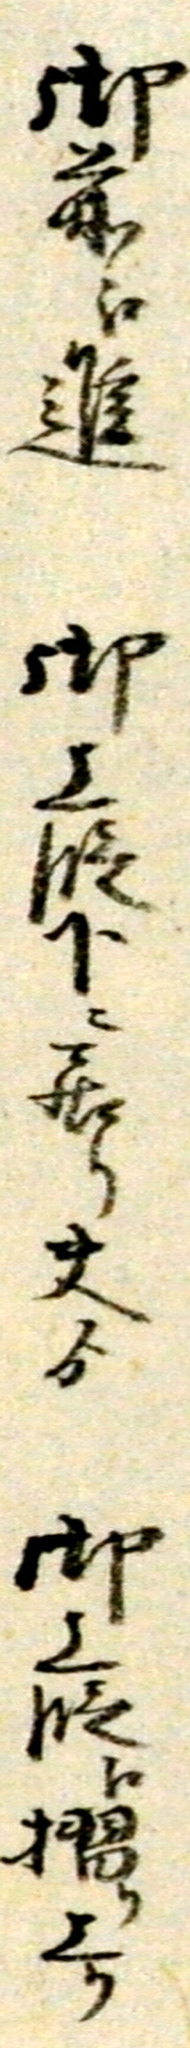御前え進御上段下ニ居り夫ゟ御上段江摺り上り
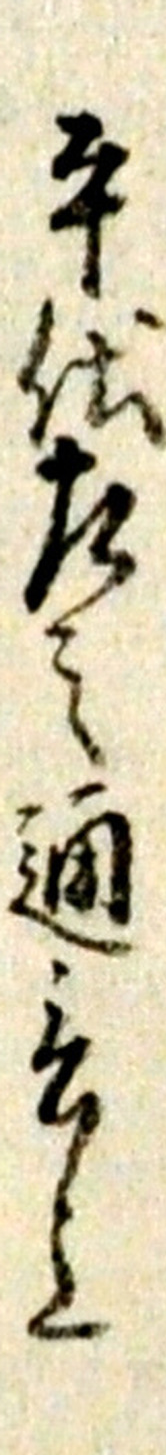平伏左之通言上
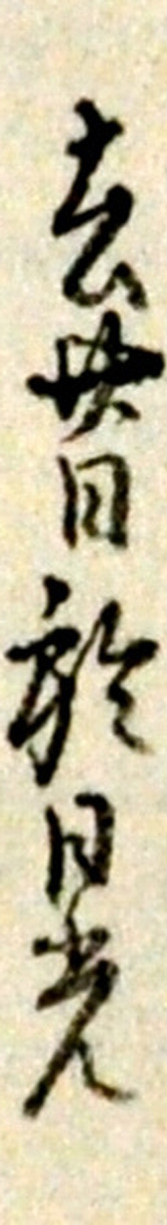去廿日於日光
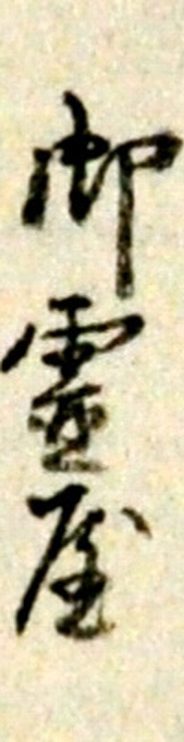御霊屋
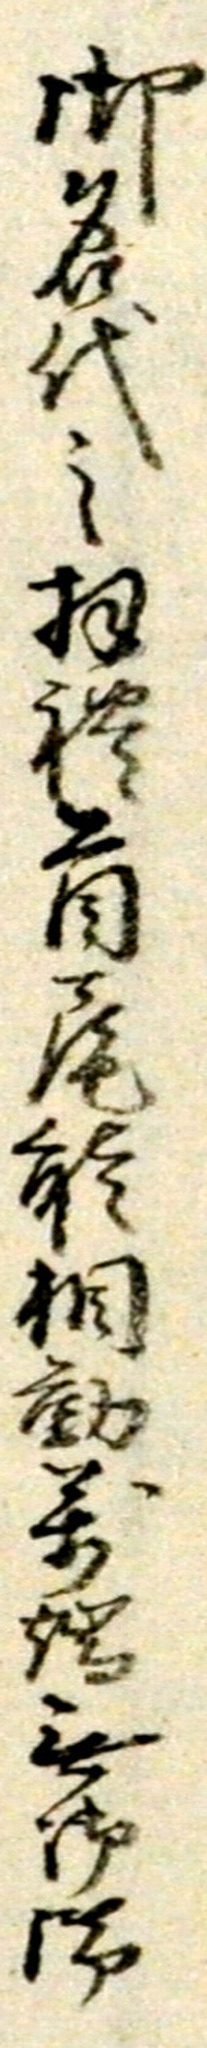御名代之拝礼首尾能相勤万端無御滞
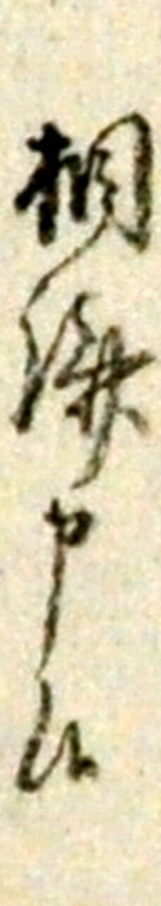相済申候
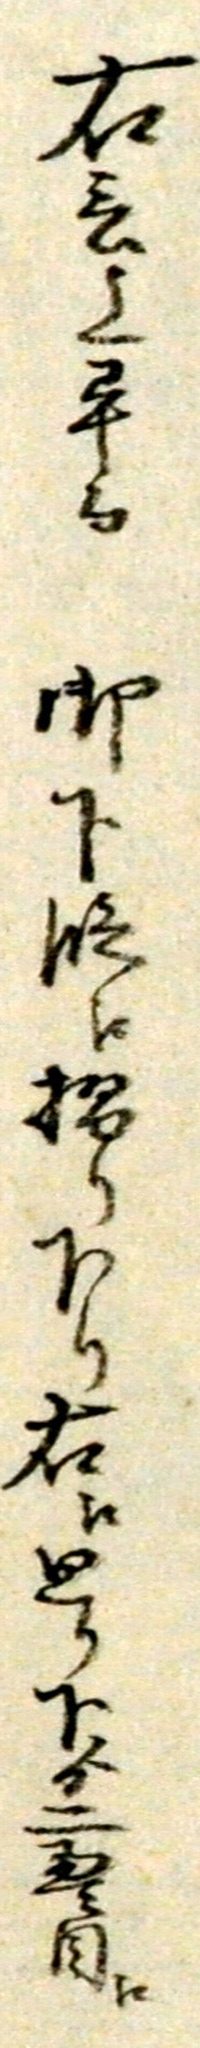右言上畢而御下段江摺り下り右江廻り下ゟ二畳目江
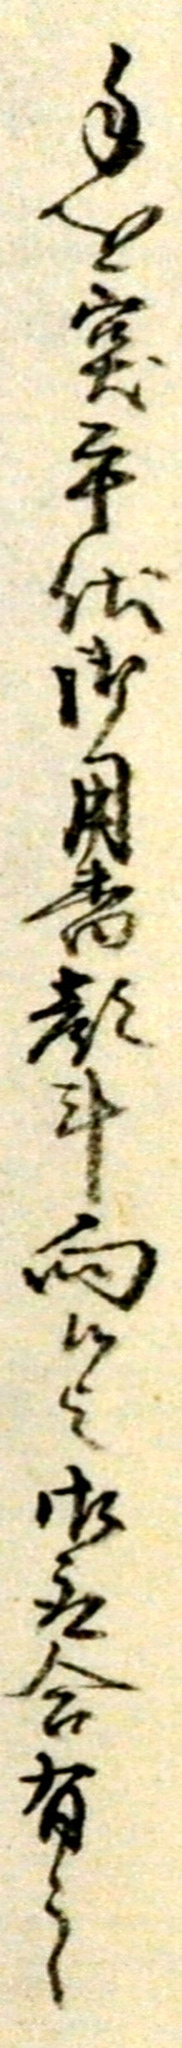手を突平伏御用番顔計向候と御取合有之
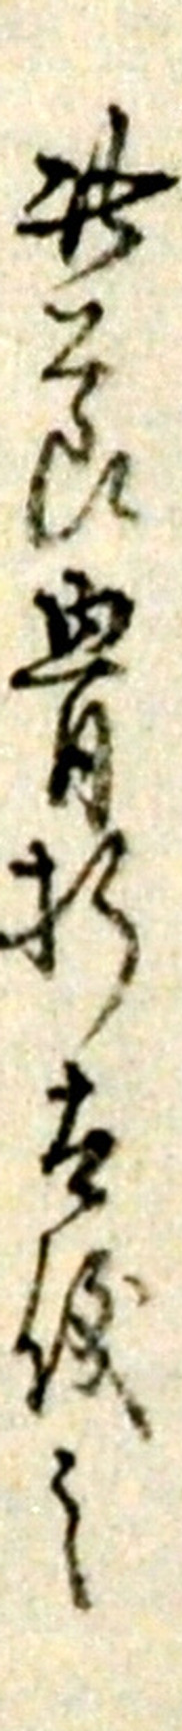此節骨折太儀之
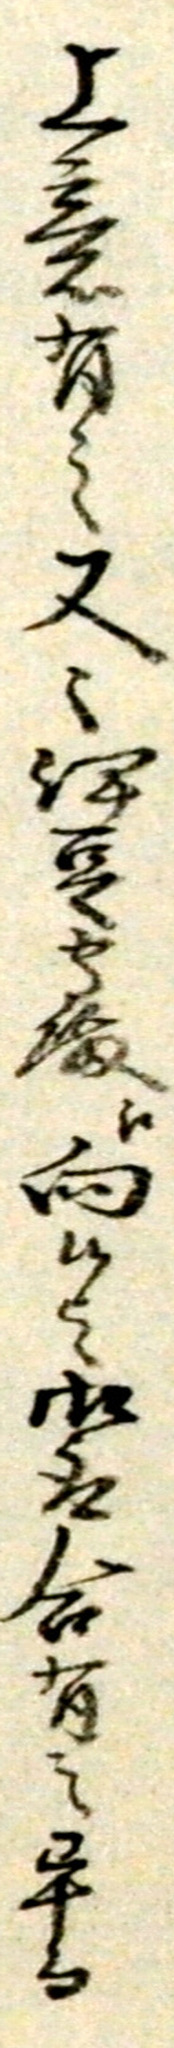上意有之又々伊豆守殿江向候旨御取合有之畢而
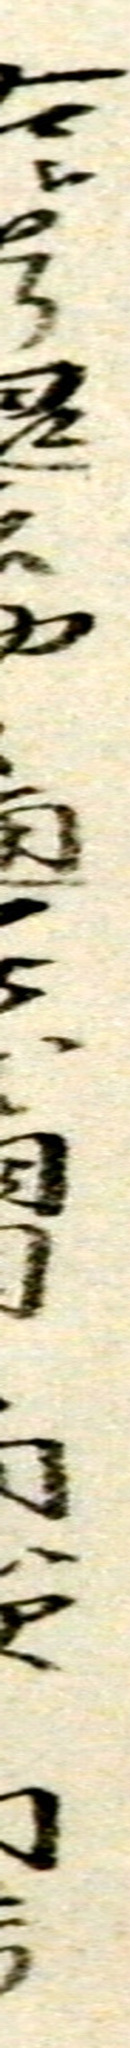右江廻り退去初之通罷出羽目之間山吹之間通り
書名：日光御名代相勤候節ノ留
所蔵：伊那市立高遠町図書館・合同会社AMANE
